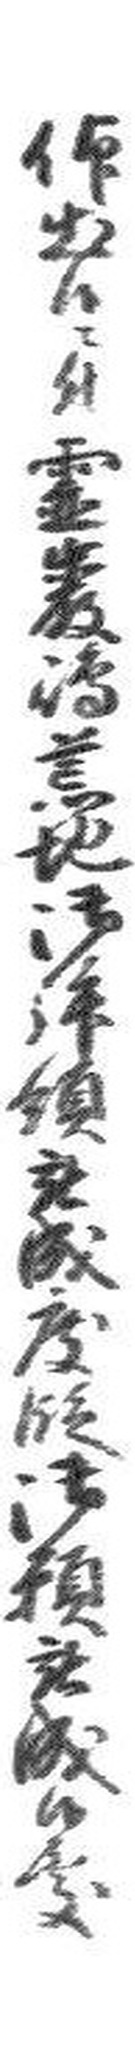仰出候ニ付霊巌島荒地御拝領被成度段御願被成候処
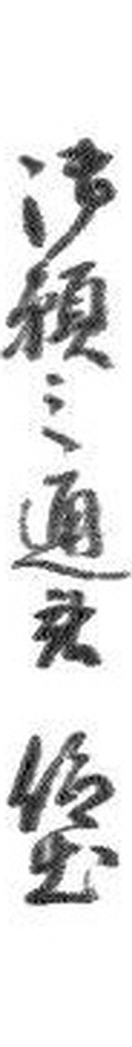御願之通被仰出
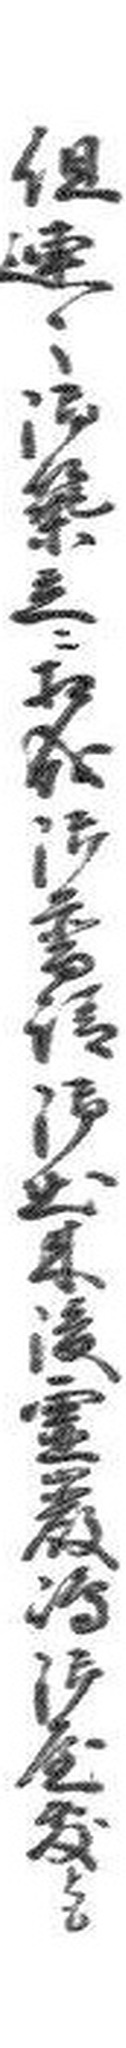但連々御築立ニ相成御普請御出来後霊巖島御屋敷とも
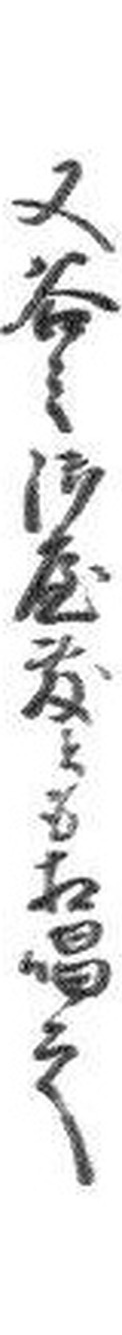又谷之御屋敷とも相唱之
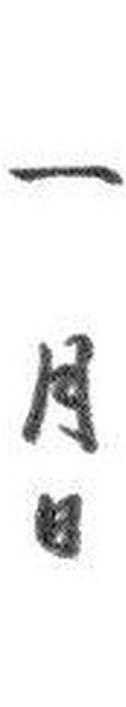一月日
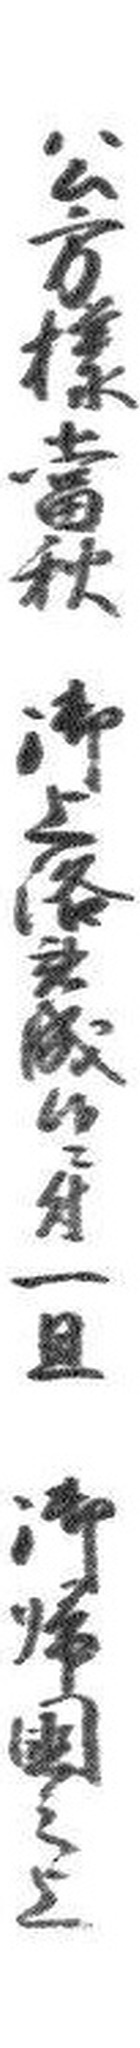公方様当秋御上洛被成候ニ付一旦御帰国之上
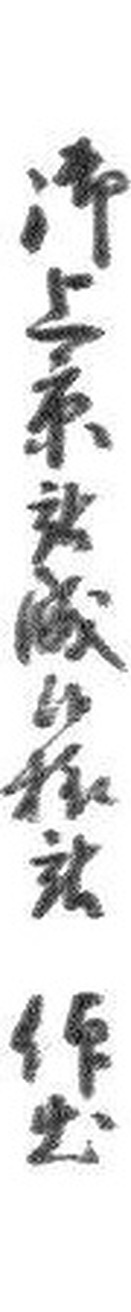御上京被成候様被仰出
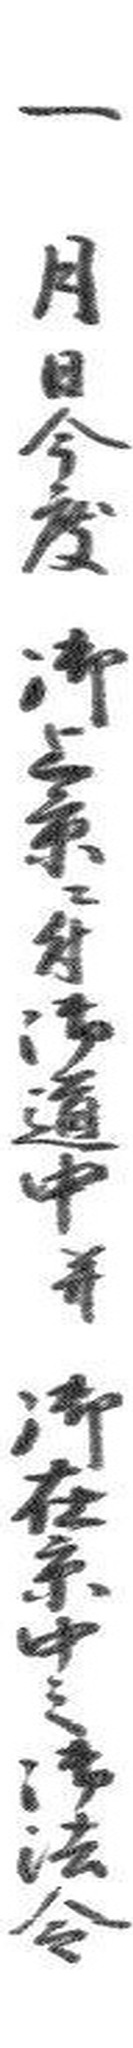一月日今度御上京ニ付御道中并御在京中之御法令

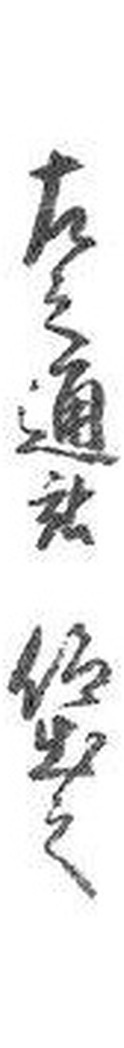左之通被仰出之
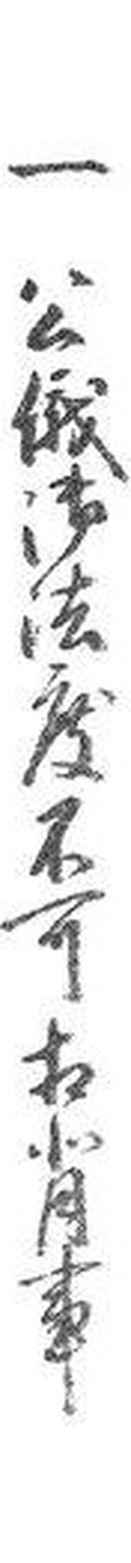一公儀御法度不可相背事
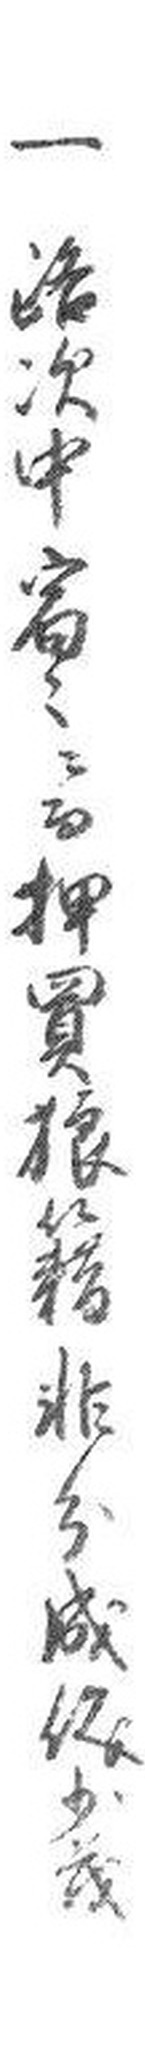一路次中宿々ニ而押買狼藉非分成儀少も
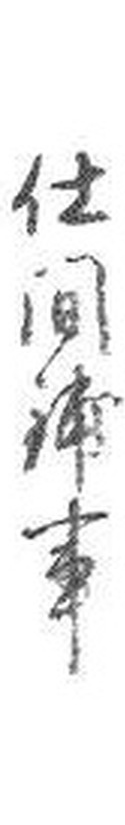仕間鋪事
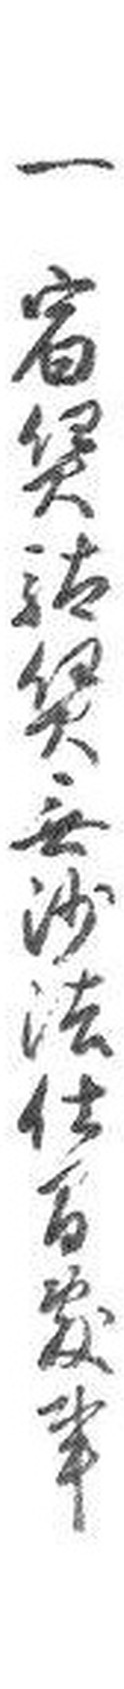一宿賃駄賃無沙法仕間敷事
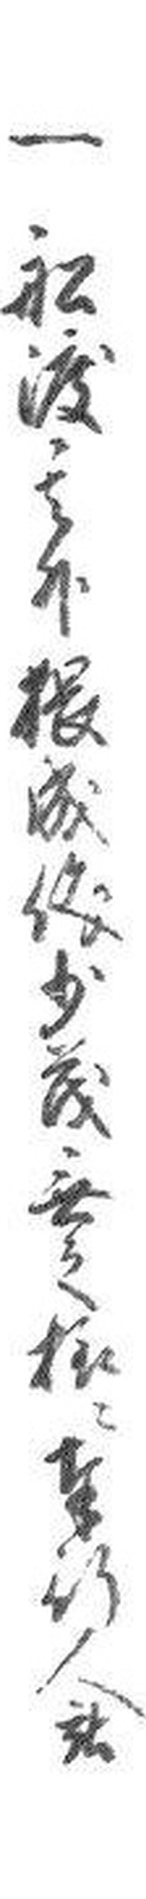一舩渡其外猥成儀少も無之様ニ奉行人被
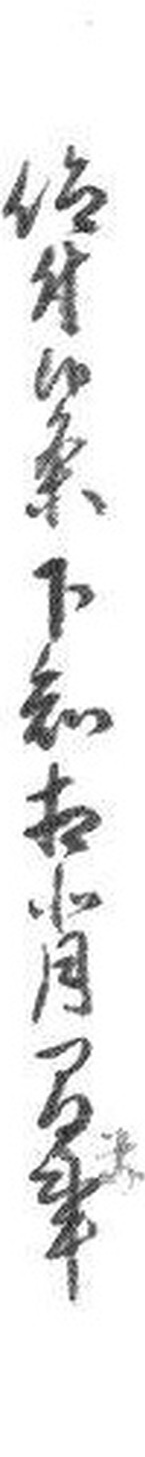仰付候条下知相背間敷事
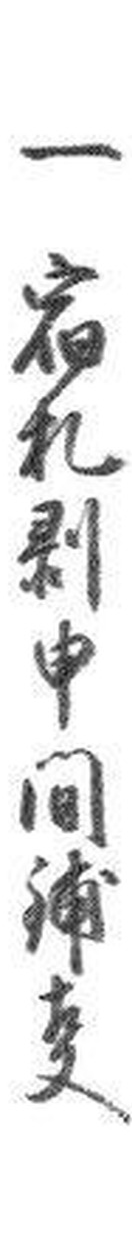一宿札剥申間鋪事
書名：家譜 四 忠昌公 従寛永七年到正保四年
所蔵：福井県文書館 Fukui Prefectural Archives
